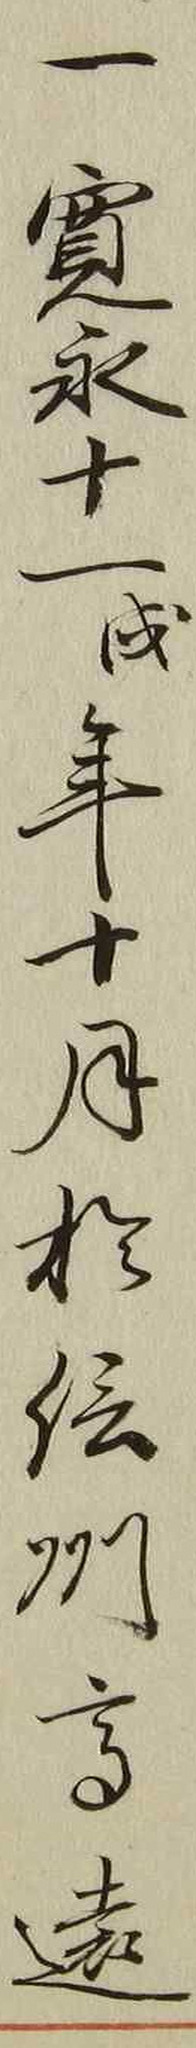一寛永十一戊年十月於信州高遠
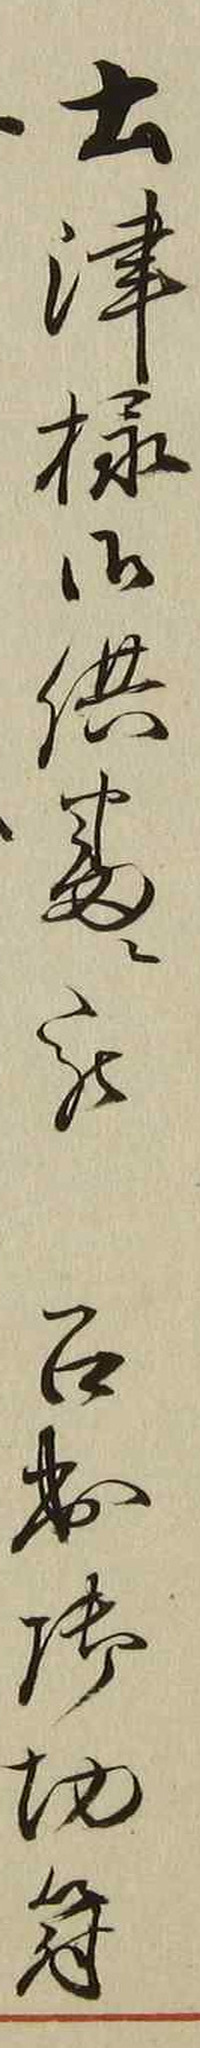土津様御供番ニ被召出御切符
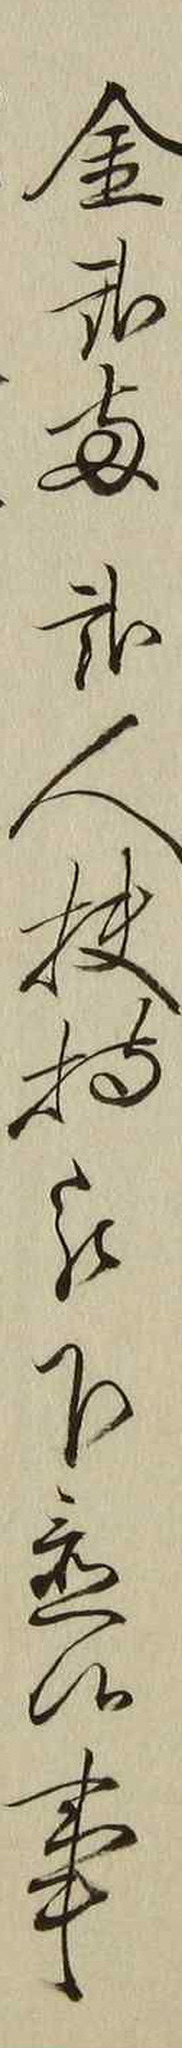金弐両弐人扶持被下置候事
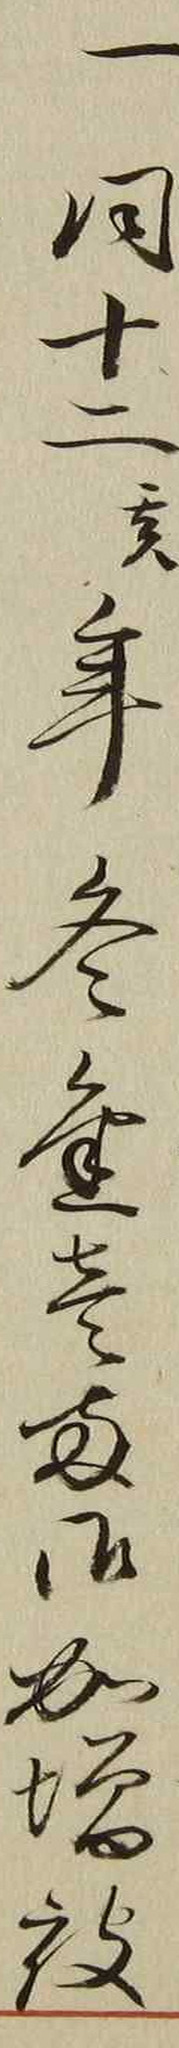一同十二年亥年冬金壱両御加増被
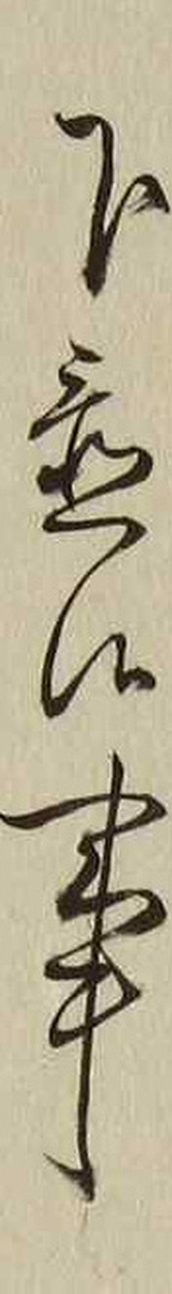下置候事
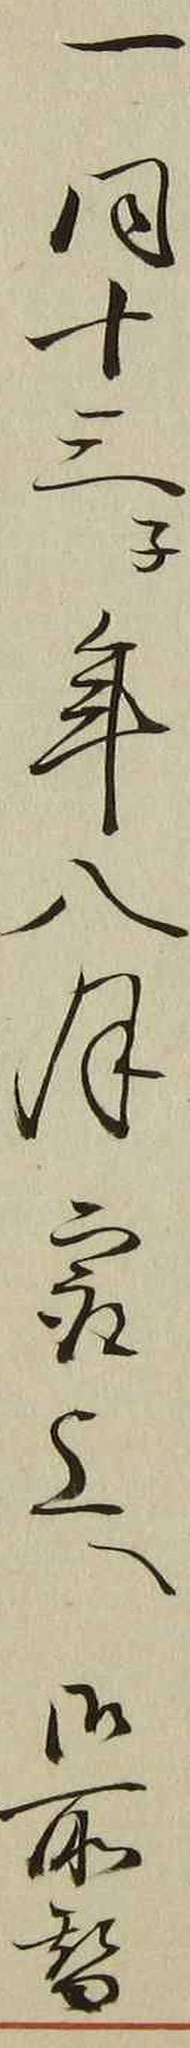一同十三子年八月最上へ御取替
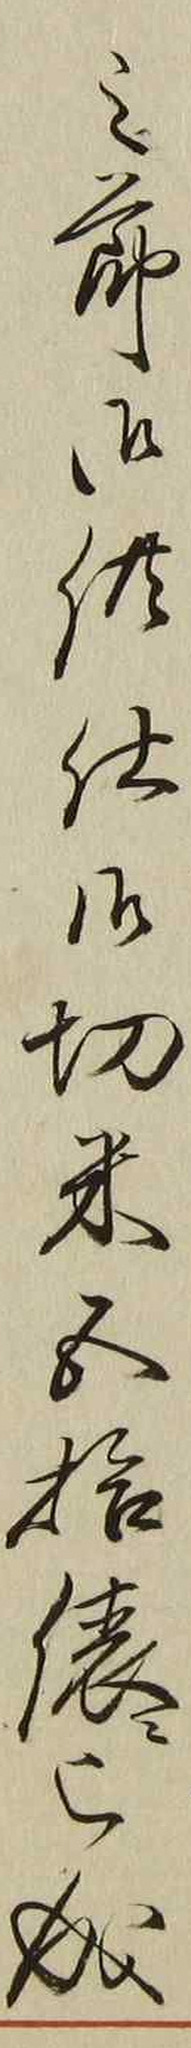之節御供仕御切米五拾俵被成
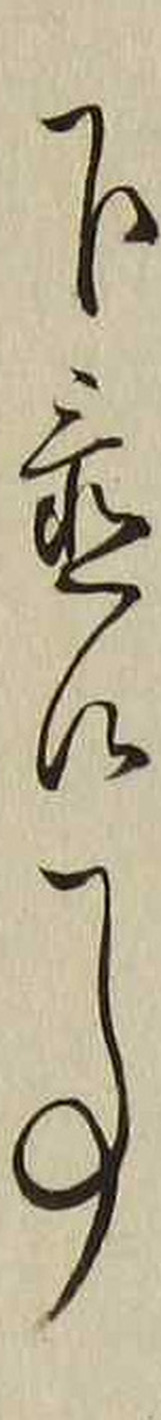下置候事
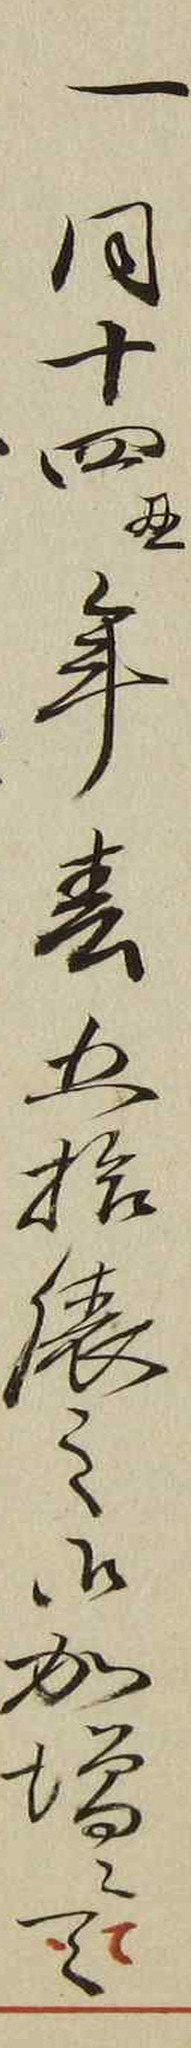一同十四丑年春五拾俵之御加増ニて
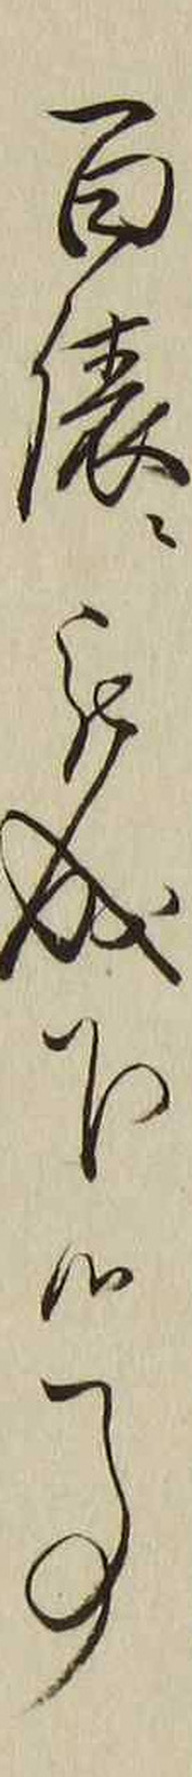百俵ニ被成下候事
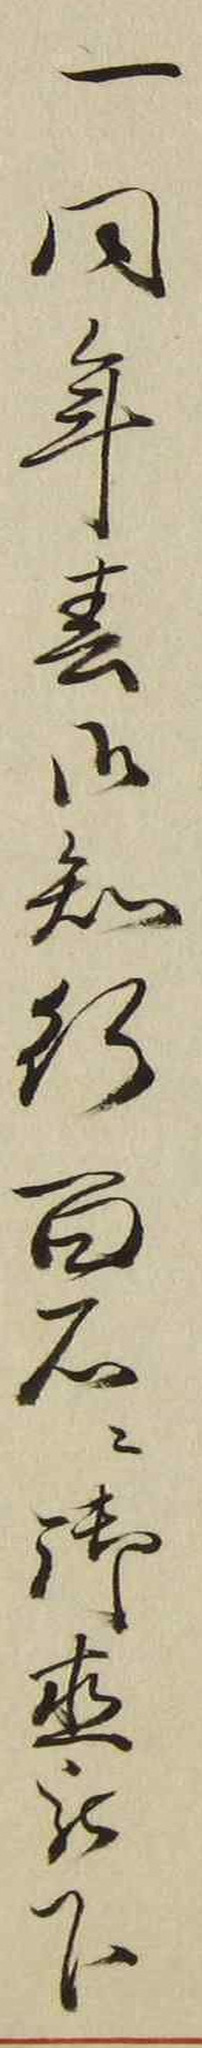一同年春御知行百石ニ御置被下

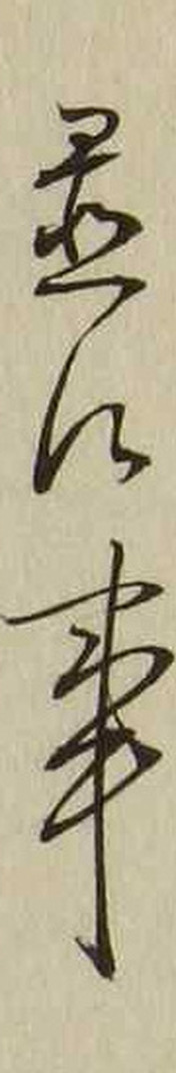置候事
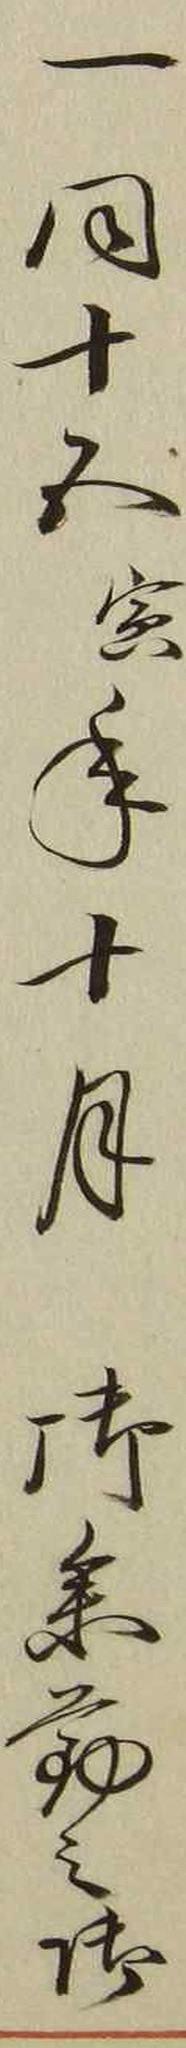一同十五寅年十月御参勤之御
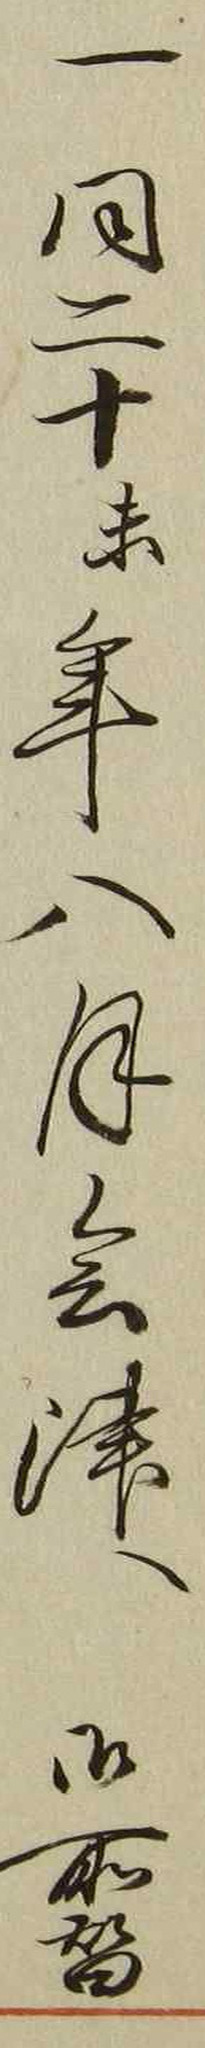一同二十未年八月会津へ御取替
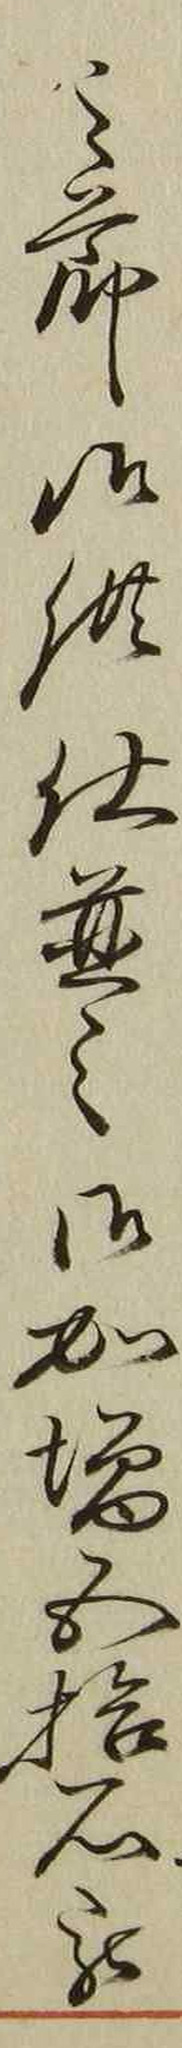之節御供仕並之御加増五拾石被
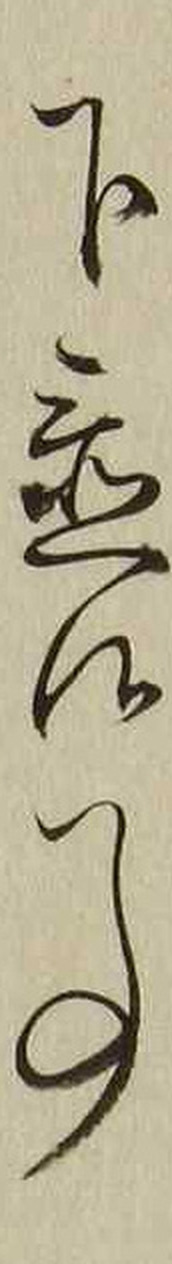下置候事
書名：諸士系譜　巻之54　ほ之部1
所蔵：会津若松市立会津図書館
